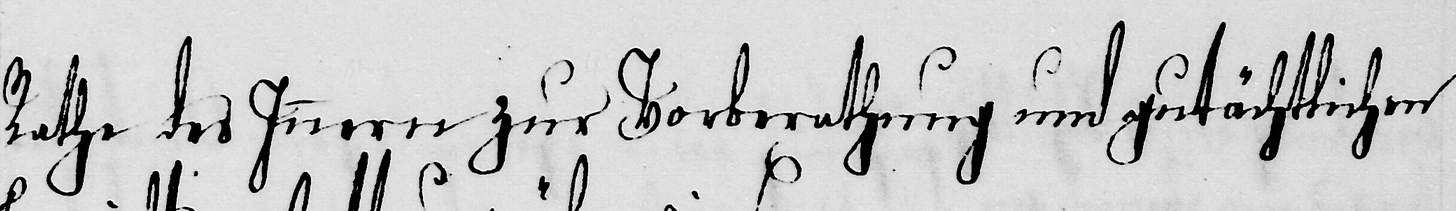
Rathe des Innern zur Vorberathung und gutächtlichen
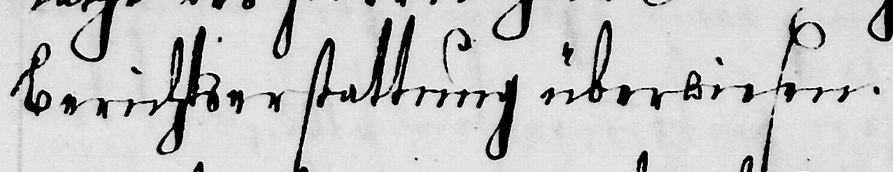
Berichtserstattung überwiesen.
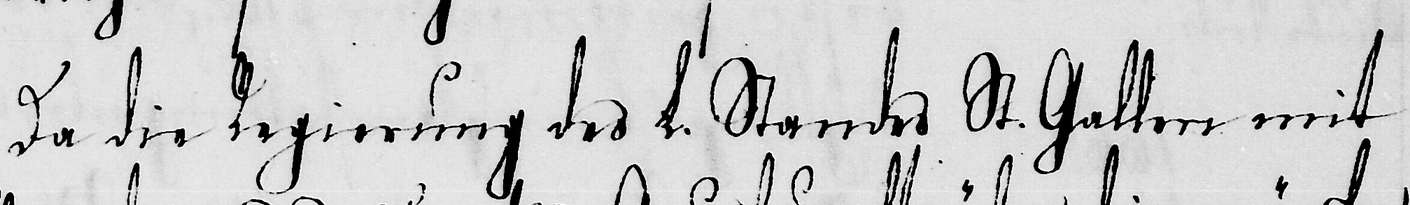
Da die Regierung des L. Standes St. Gallen mit
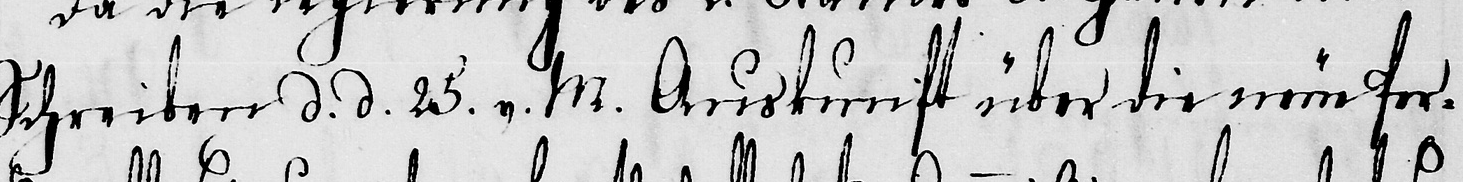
Schreiben d. d. 25. v. M. Auskunft über die neue Pe¬
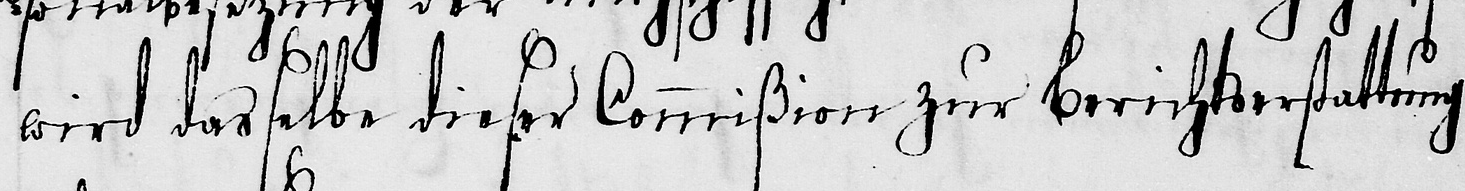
wird dasselbe dieser Commißion zur Berichterstattung
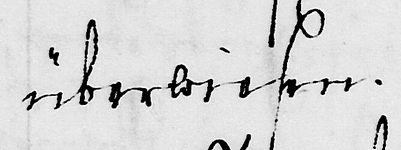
überwiesen.
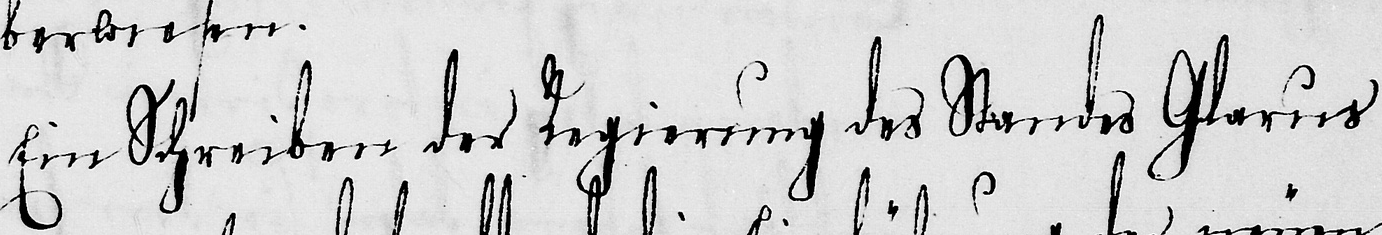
Ein Schreiben der Regierung des Standes Glarus
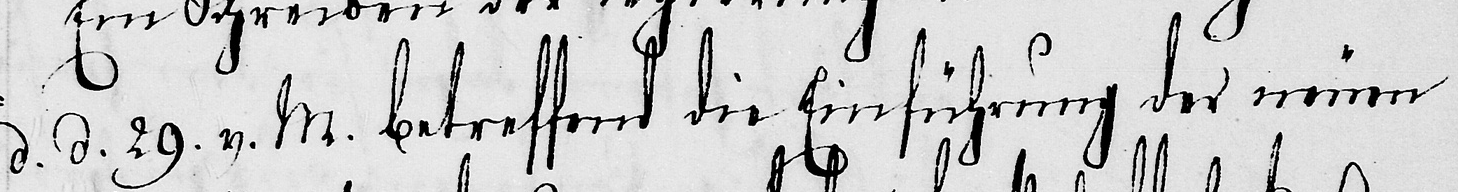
d. d. 29. v. M. betreffend die Einführung der neuen
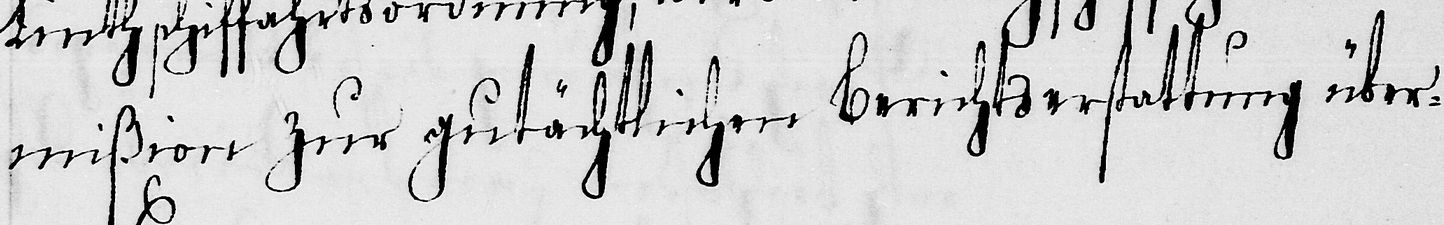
mißion zur gutächtlichen Berichtserstattung über¬
